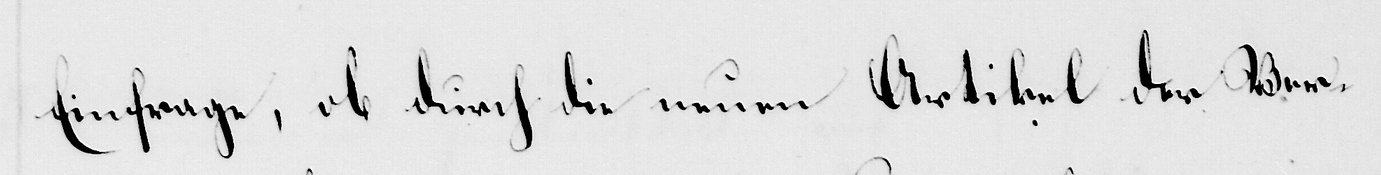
Einfrage, ob durch die neuen Artikel der Ver¬
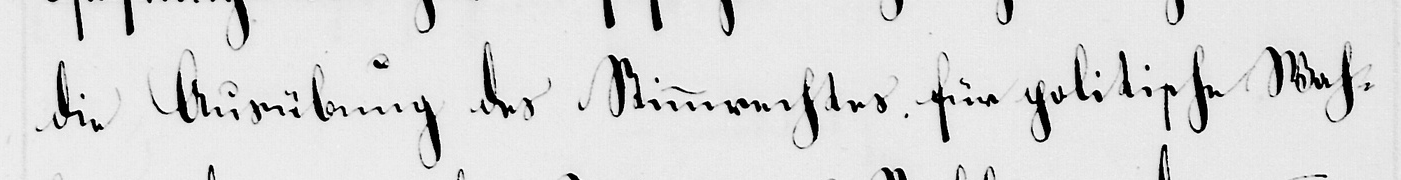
die Ausübung des Stimmrechtes für politische Wah¬
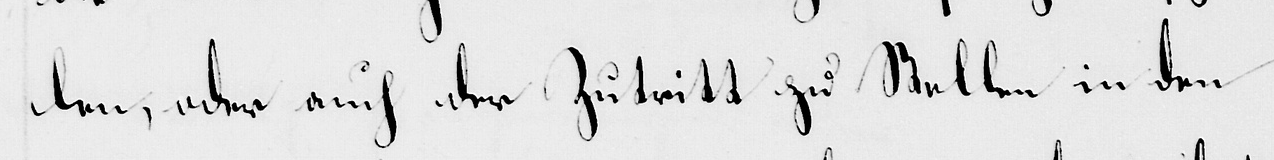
len, oder auch der Zutritt zu Stellen in den
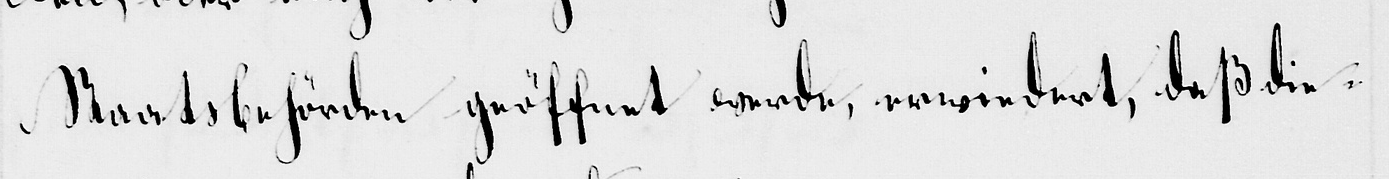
Staatsbehörden geöffnet werde, erwiedert, daß die¬
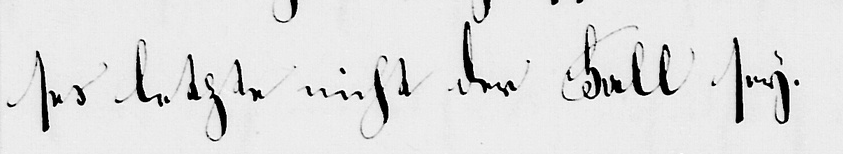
ses letzte nicht der Fall sey.
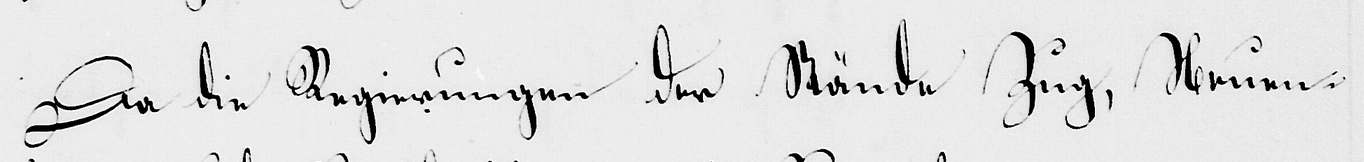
Da die Regierungen der Stände Zug, Neuen¬
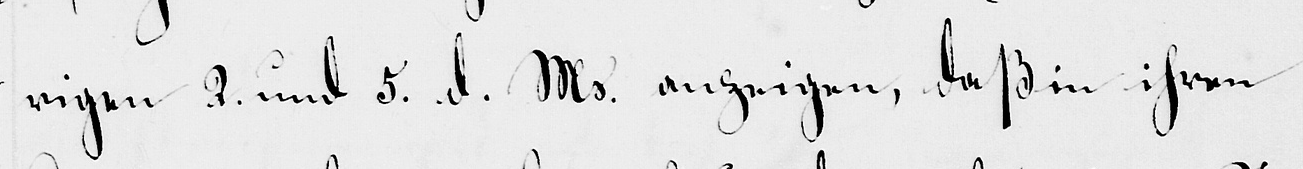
rigen 2. und 5. d. Ms. anzeigen, daß in ihren
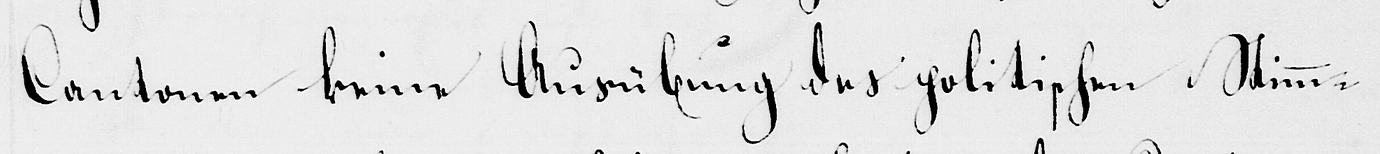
Cantonen keine Ausübung des politischen Stimm¬
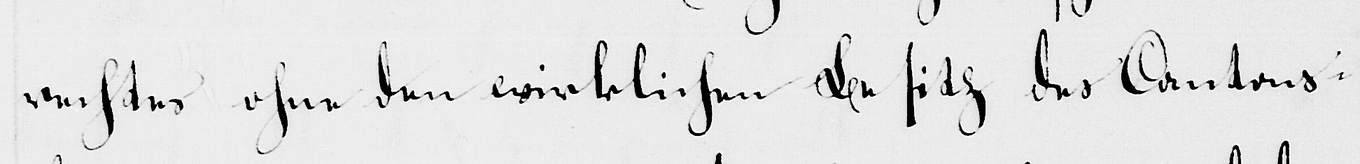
rechtes ohne den wirklichen Besitz des Cantons¬
